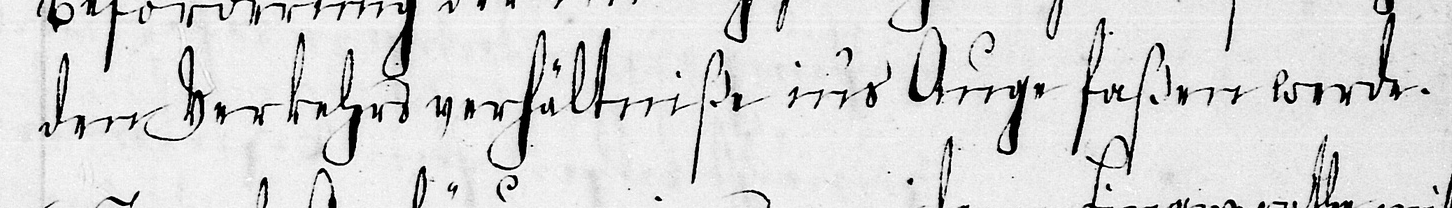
den Verkehrsverhältniße ins Auge faßen werde.
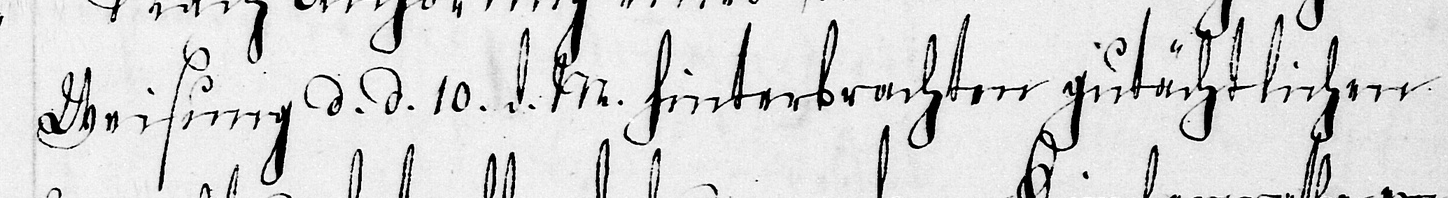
Weisung d. d. 10. d. M hinterbrachten gutächtlichen
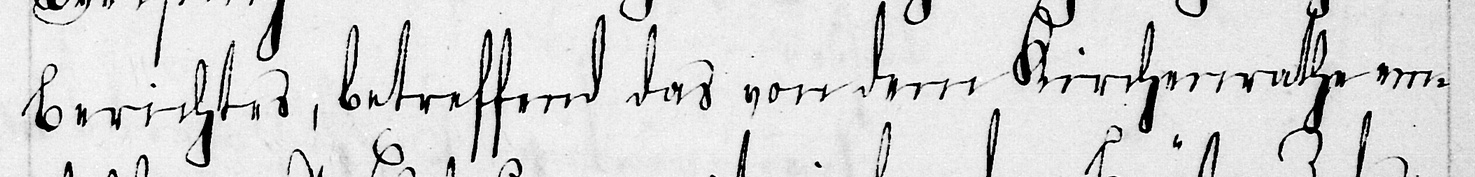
Berichtes, betreffend das von dem Kirchenrathe em¬
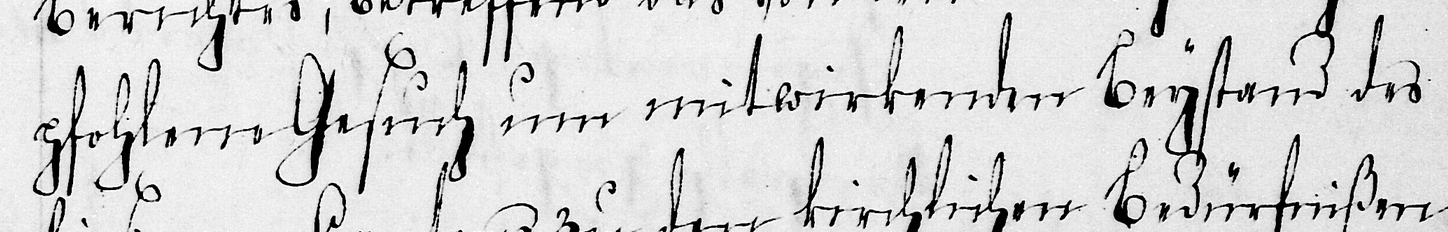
pfohlene Gesuch um mitwirkenden Beystand des
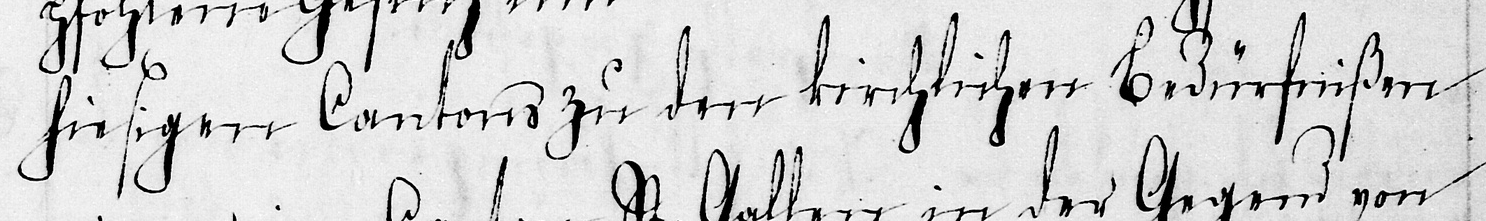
hiesigen Cantons zu den kirchlichen Bedürfnißen
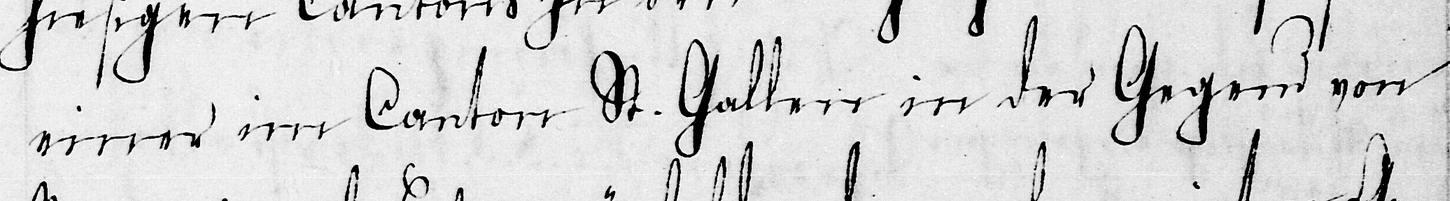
einer im Canton St. Gallen in der Gegend von
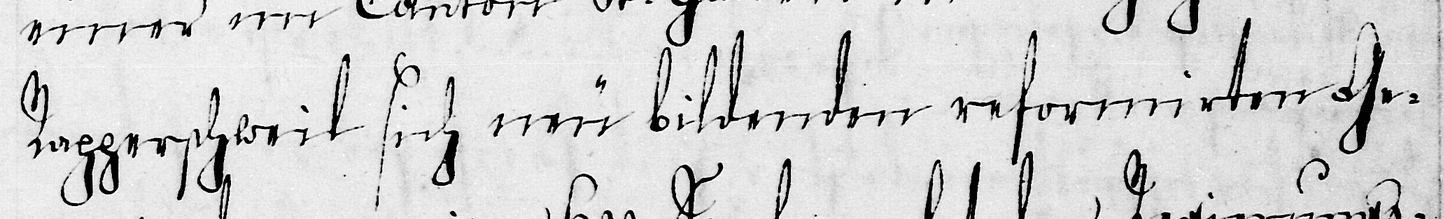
Rapperschweil sich neu bildenden reformirten Ge¬
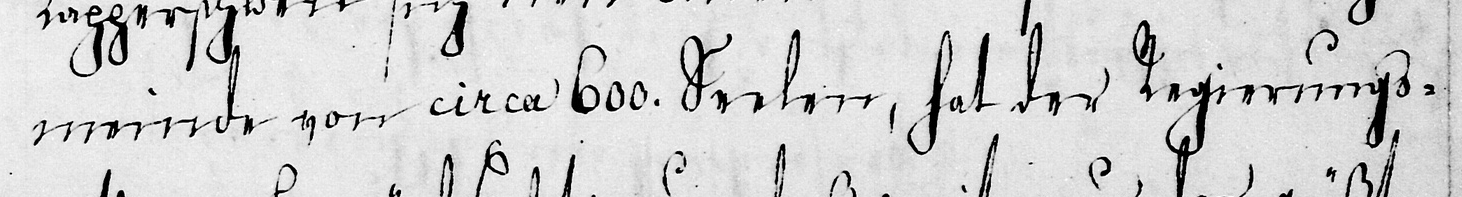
meinde von circa 600. Seelen, hat der Regierungs¬
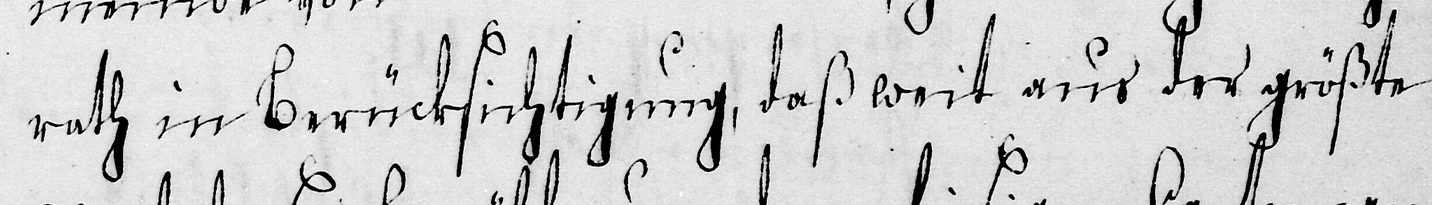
rath in Berücksichtigung, daß weit aus der größte
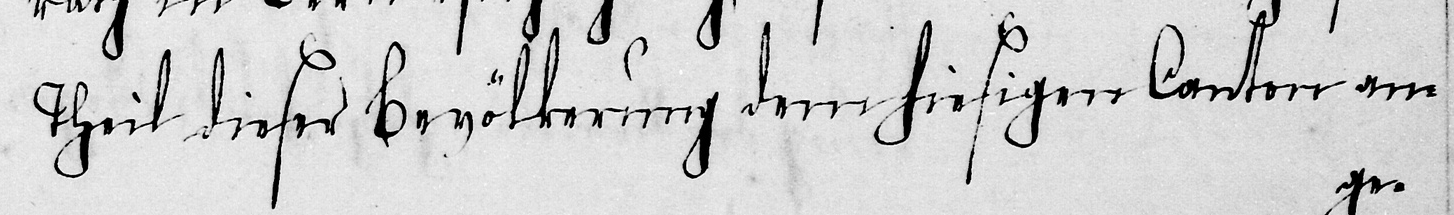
Theil dieser Bevölkerung dem hiesigem Canton an-
